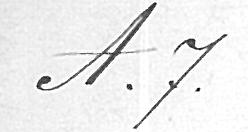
A. 7.
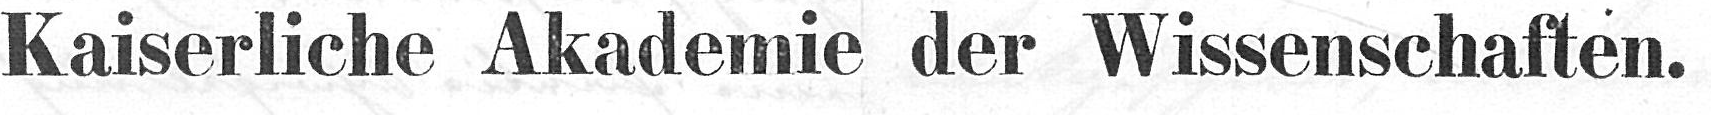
Kaiserliche Akademie der Wissenschaften.
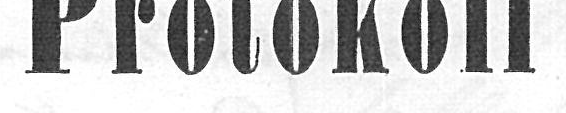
Protokoll
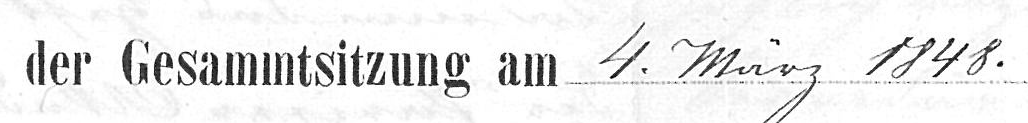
der Gesammtsitzung am 4. März 1848.
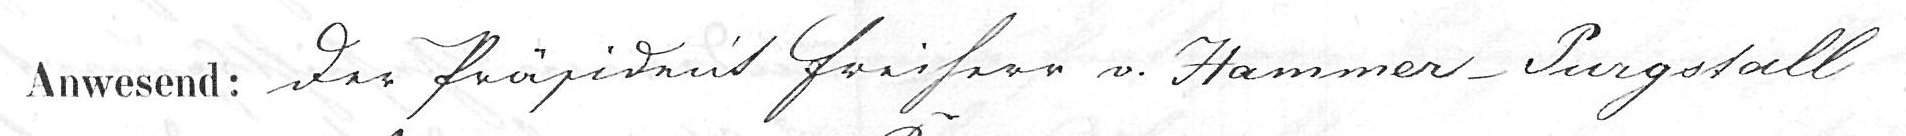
Anwesend: Der Präsident Freiherr v. Hammer-Purgstall
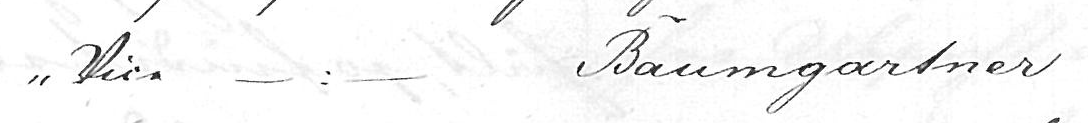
" Vice- . . . . . . Baumgartner
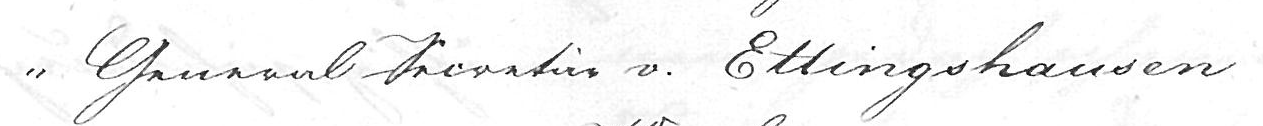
" General-Secretär v. Ettingshausen
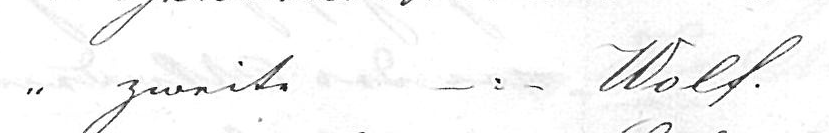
" zweite . . . . . Wolf
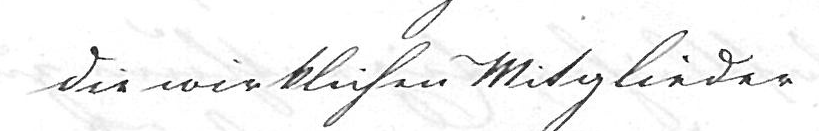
die wirklichen Mitglieder
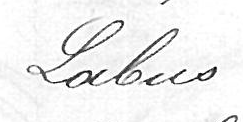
Labus
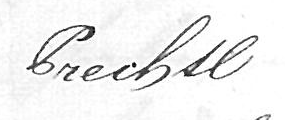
Prechtl
